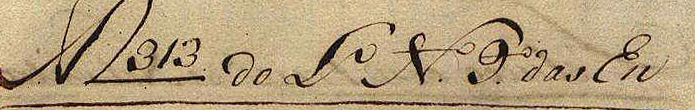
R313 do L.o N.o 9.o das En
